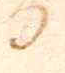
5
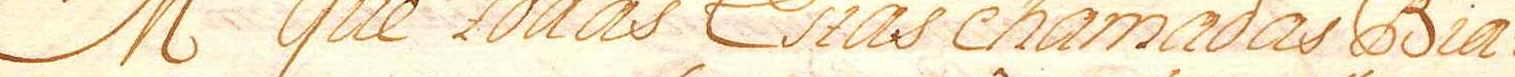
M que todas Estas chamadas Bia
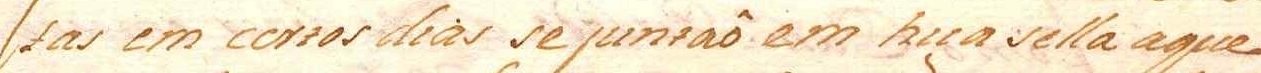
tas em certos dias se juntaõ em hua sella a que
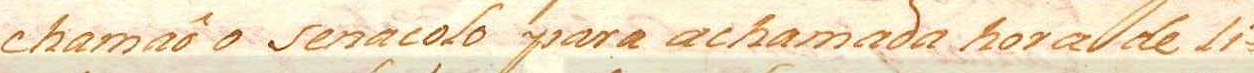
chamaõ o senacolo para a chamada hora de li
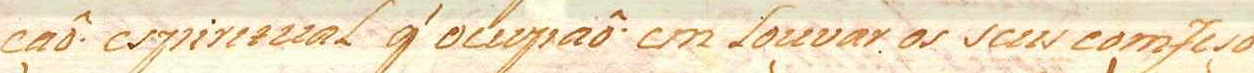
çaõ espirituaL q̄ ocupaõ em Louvar os seus comfeso
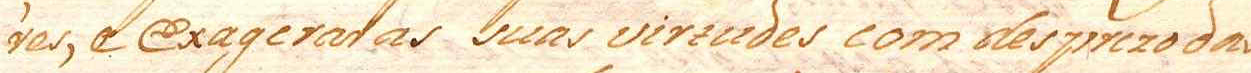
res, e exagerar as suas virtudes com desprezo das
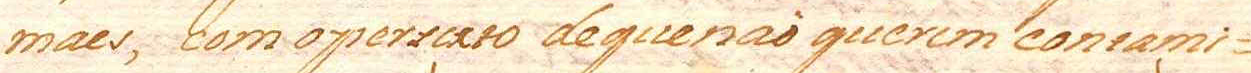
maes, com a pertexto de que naõ querem contami
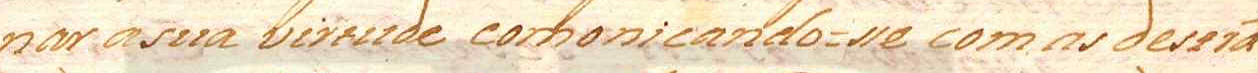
nar a sua virtude comonicando=sse com as destra
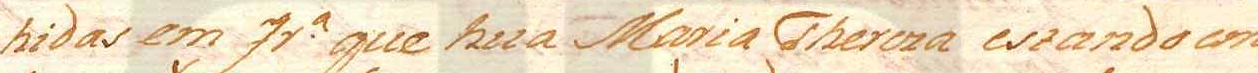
hidas em fr.a que hua Maria Thereza estando em
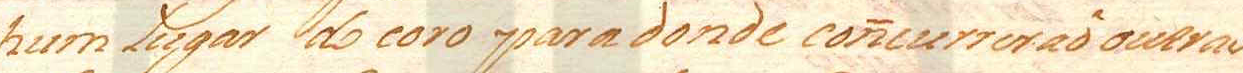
hum Lugar do coro para donde con̄curreraõ outras
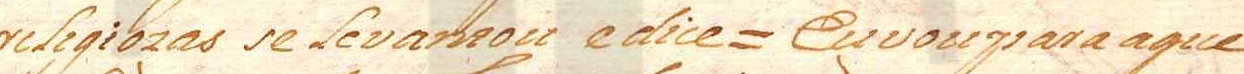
reLigiozas se Levantou e dice= Eu vou para aque
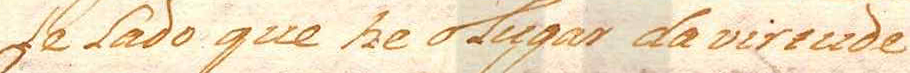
Le Lado que he o Lugar da virtude
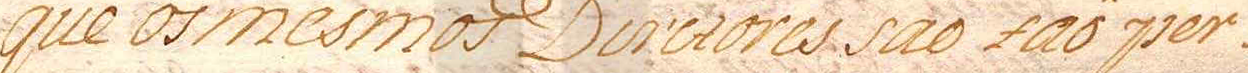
que os mesmos Diretores saõ taõ per
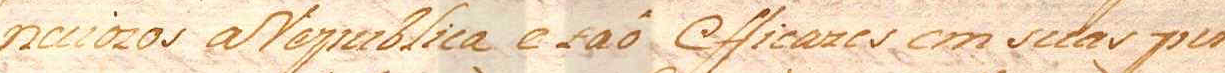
niciozos a repubLica e taõ efficazs em suas per
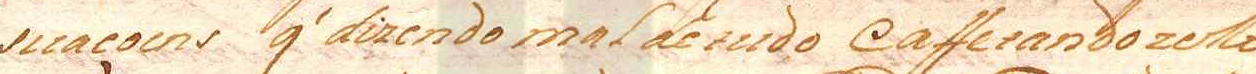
saçoens q̄ dizendo maL de tudo e affetando zello
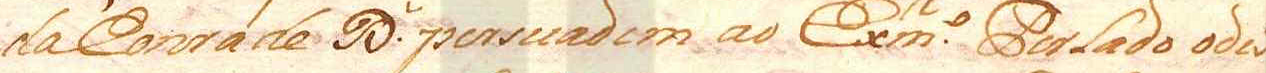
da honra de D.s persuadem ao Exm.o PerLado odis
